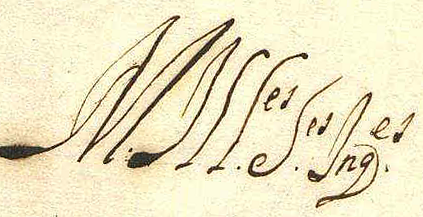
M. Ill.es S.es Inq.es
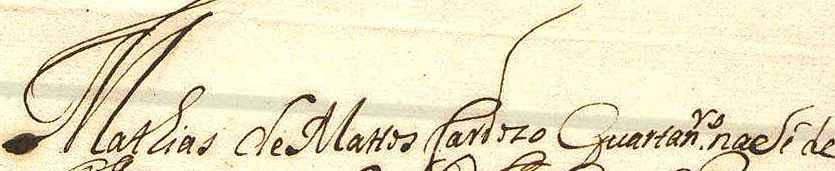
Mathias de Mattos Cardozo Quartan.ro na Sé de
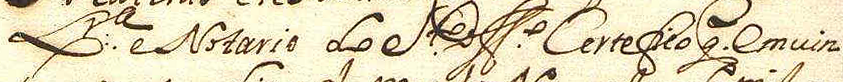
Lr.a e Notario do S.to off.o Certefico q̄ em uin
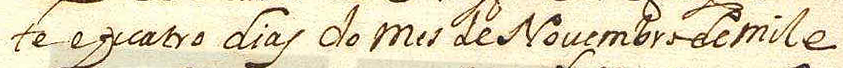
te e quatro dias do mes de Nouembro de mil e
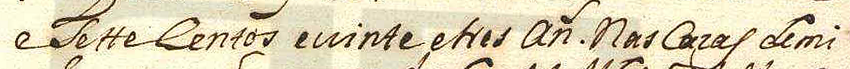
e setteCentos e uinte e tres an.s nas cazas de mi
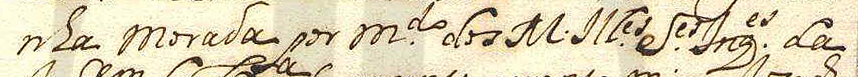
nha morada por m.do dos M. Ill.es S.es Inq.es da
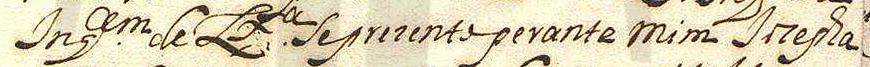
Inq.çam de Lx.a se prezento perante mim Iozepha
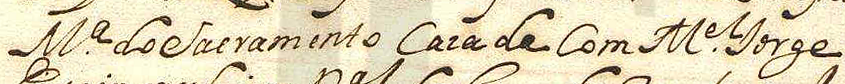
M.a do Sacramento Cazada Com M.el Iorge
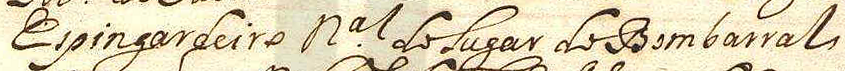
Espingardeiro N.al do lugar do Bombarral
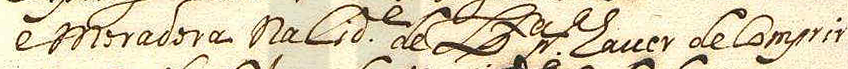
e moradora na Cid.e de Lx.a p.a hauer de Comprir
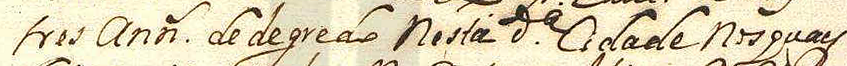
tres ann.s de degredo nesta d.a Cidade nos quaes
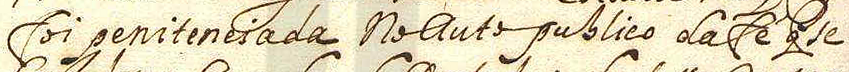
foi penitenciada no Auto publico da fé q̄ se
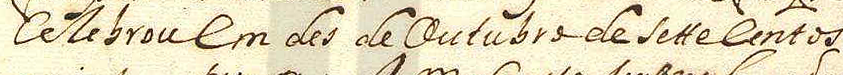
Celebrou Em des de Outubro de setteCentos
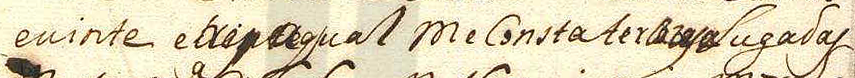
e uinte e tres a qual me Consta ter casas alugadas
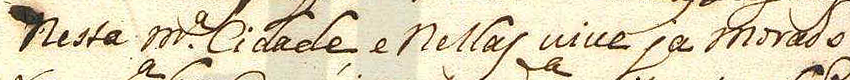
nesta m.a Cidade, e nellas uiue ja morado
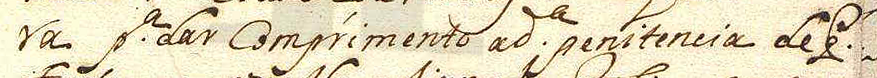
ra p.a dar Comprimento a d.a penitencia de q̄.
